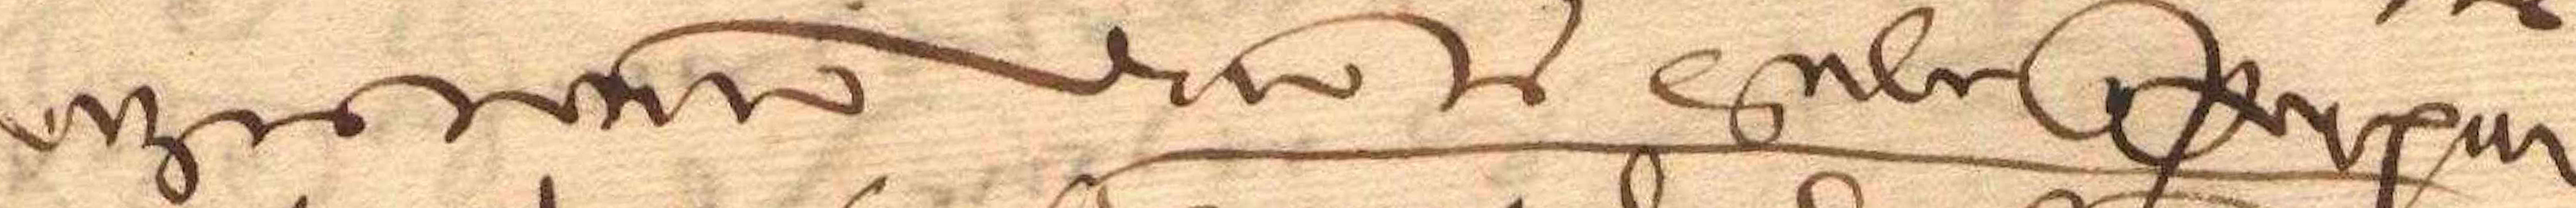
vezes como dito tē e sabe q̄ foy pur
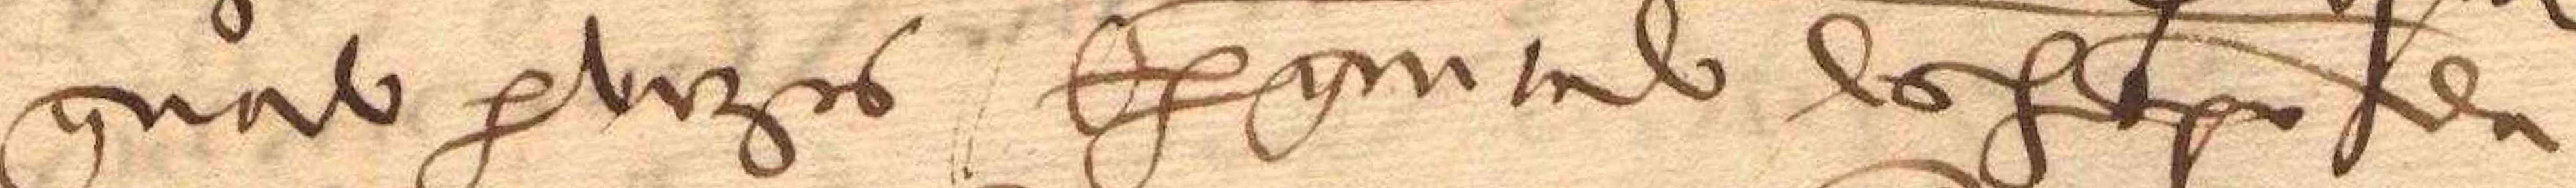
guado ꝑ vezes // E ꝑguntado des ho t̄po da
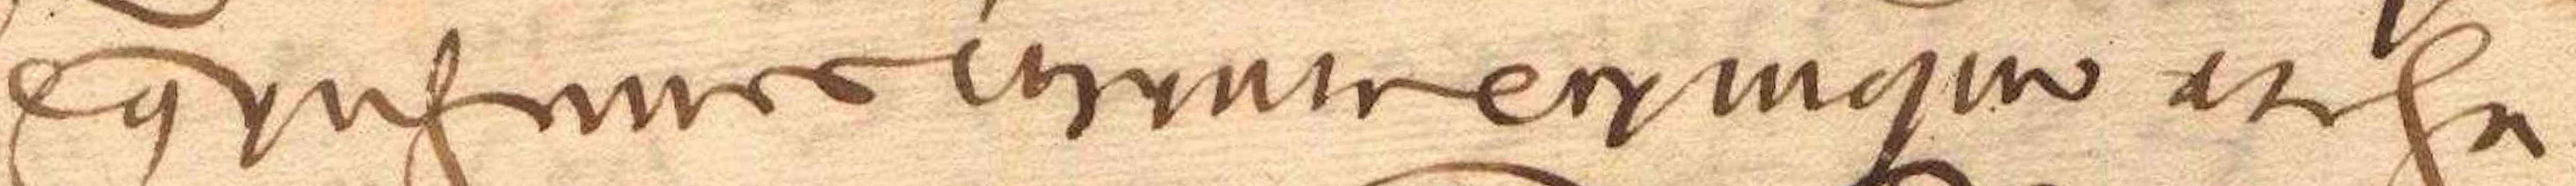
e q̄ynhentos e trynta e cymquo ate ha
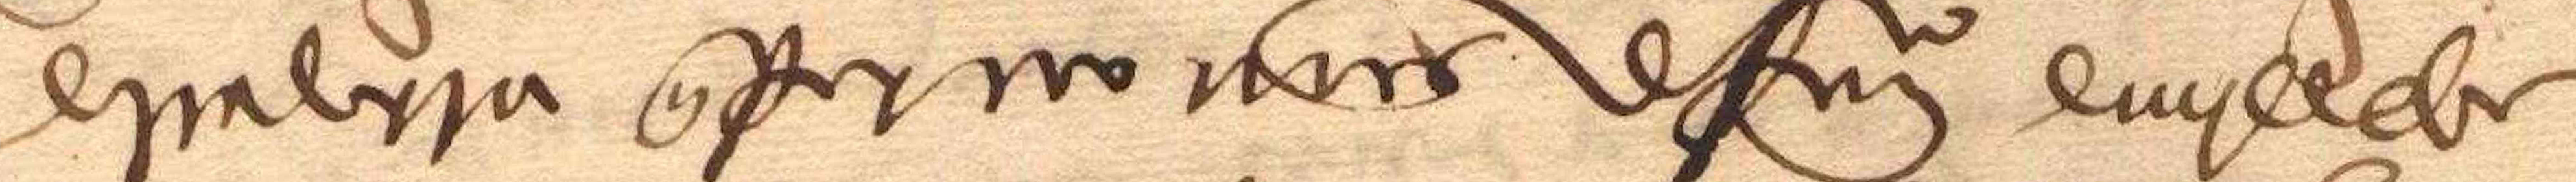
derradeyra q̄ foy no mes de feuro de mjll e bc
